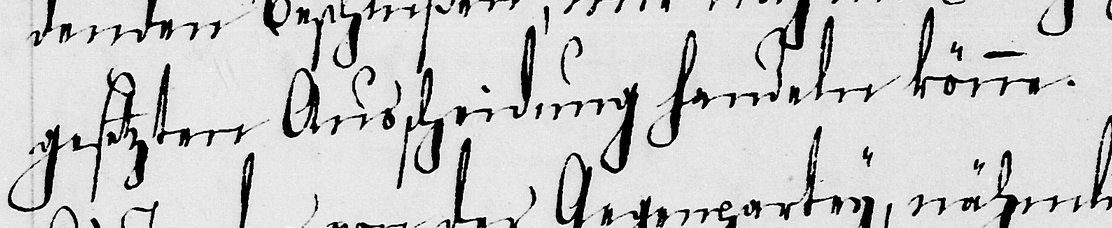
gesetzten Ausscheidung handeln könne.
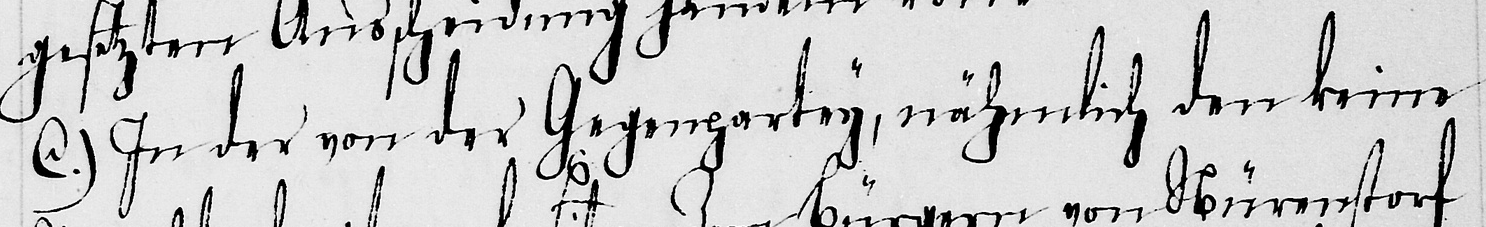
C.) In der von der Gegenpartey, nähmlich den keine
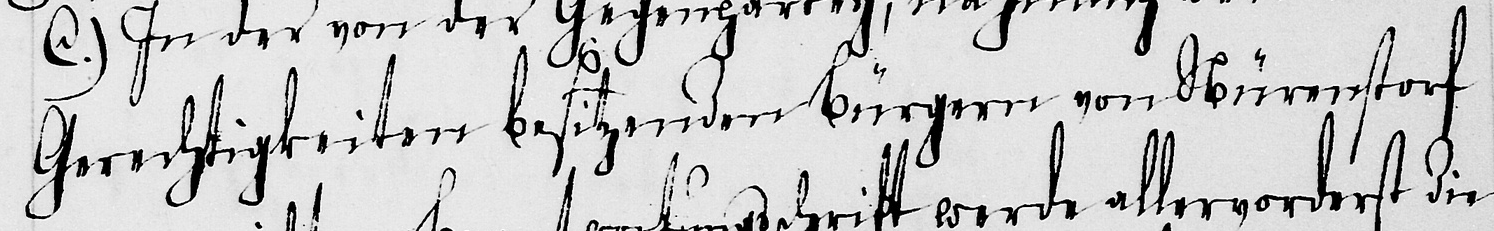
Gerechtigkeiten besitzenden Bürgern von Nürenstorf
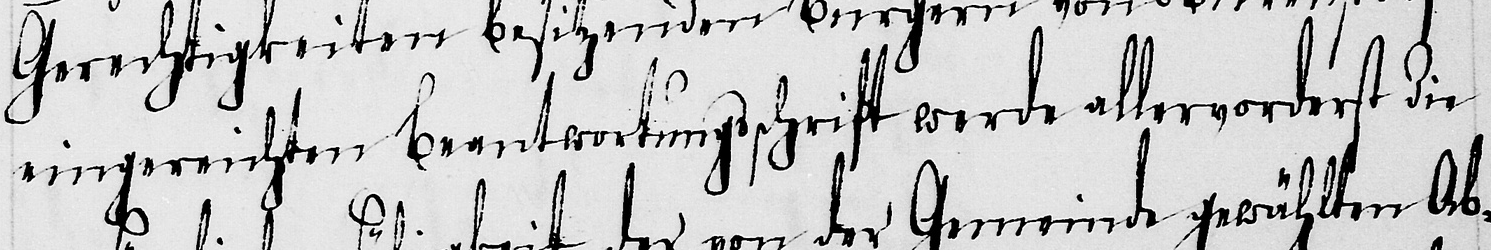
eingereichten Beantwortungsschrift werde allervorderst die
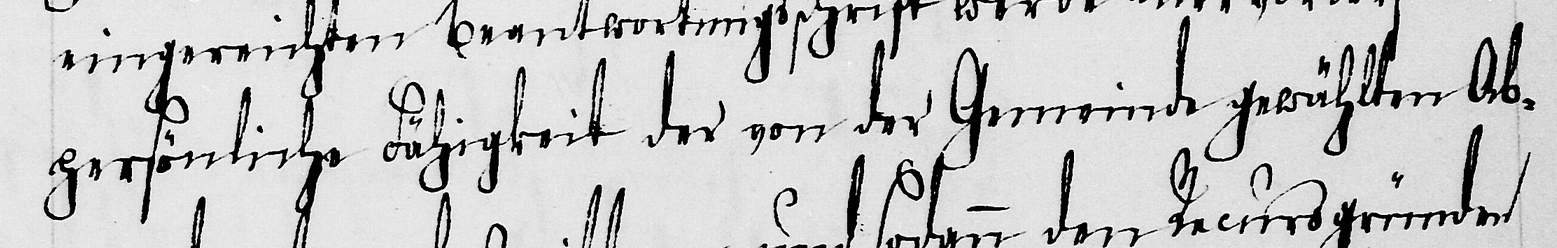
persönliche Fähigkeit der von der Gemeinde gewählten Ab¬
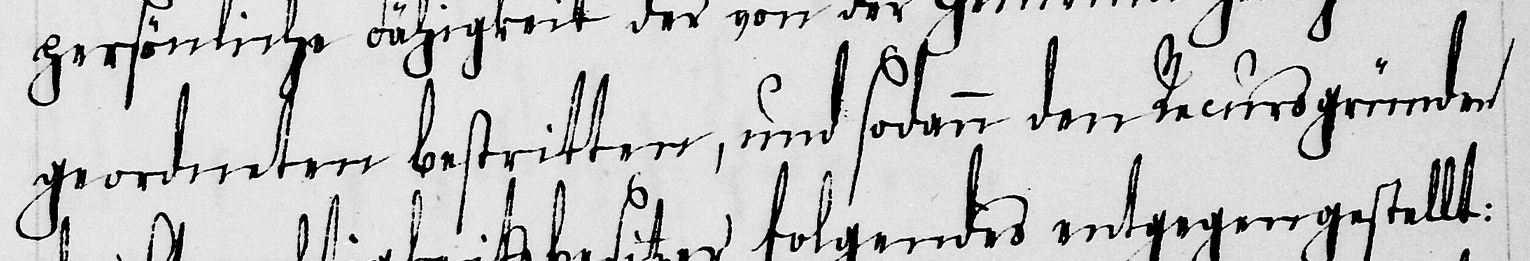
geordneten bestritten, und sodann den Recursgründen
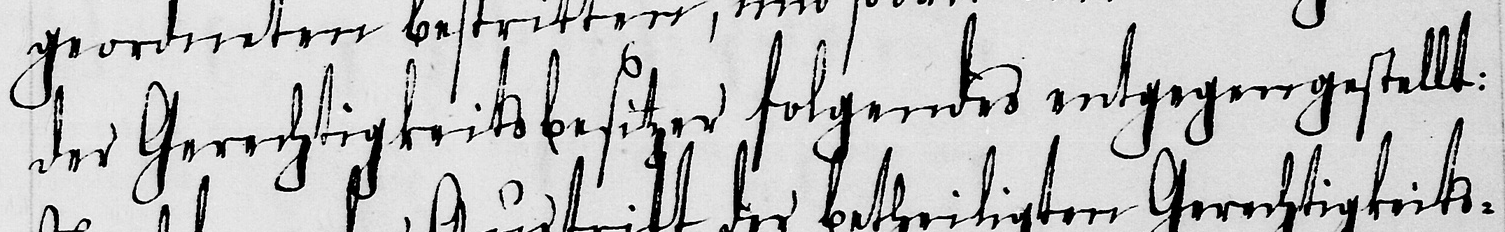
der Gerechtigkeitsbesitzer folgendes entegegengestellt:
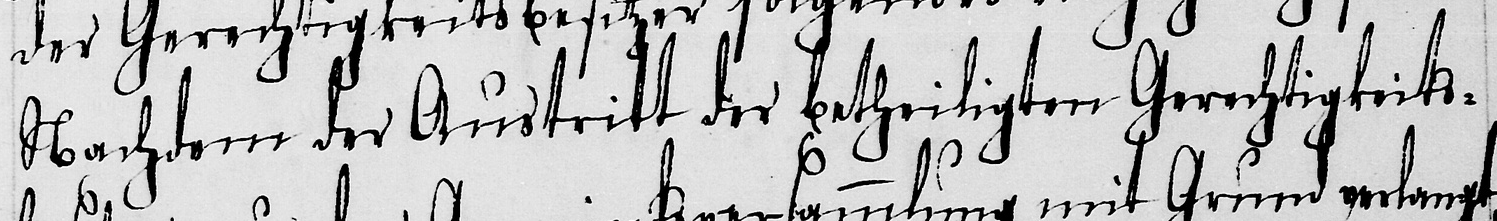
Nachdem der Austritt der betheiligten Gerechtigkeits¬
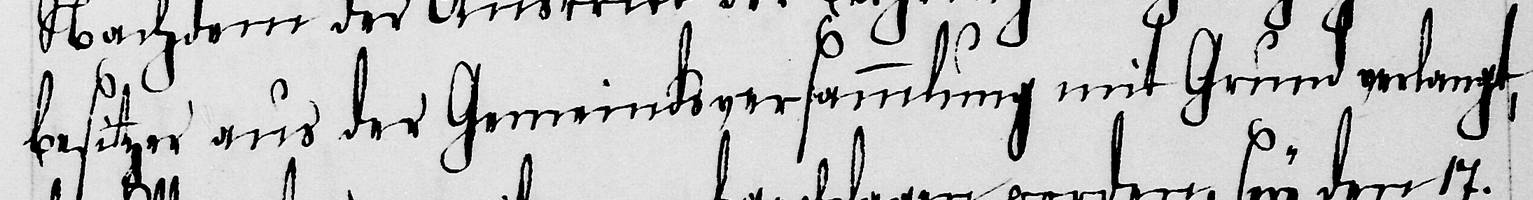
besitzer aus der Gemeindsversammlung mit Grund verlangt,
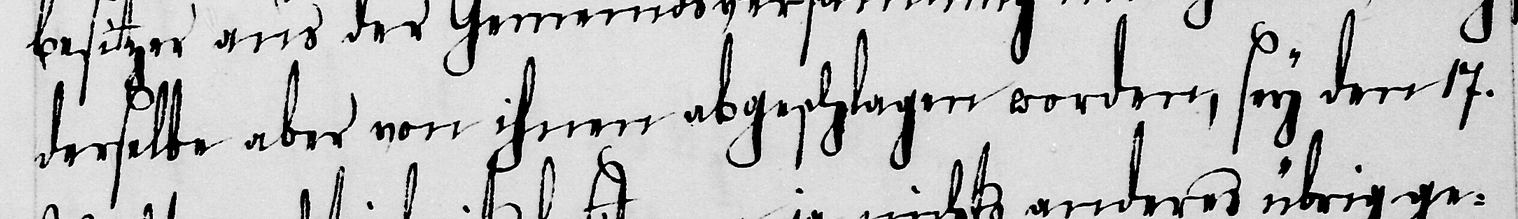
derselbe aber von ihnen abgeschlagen worden, sey den 17.
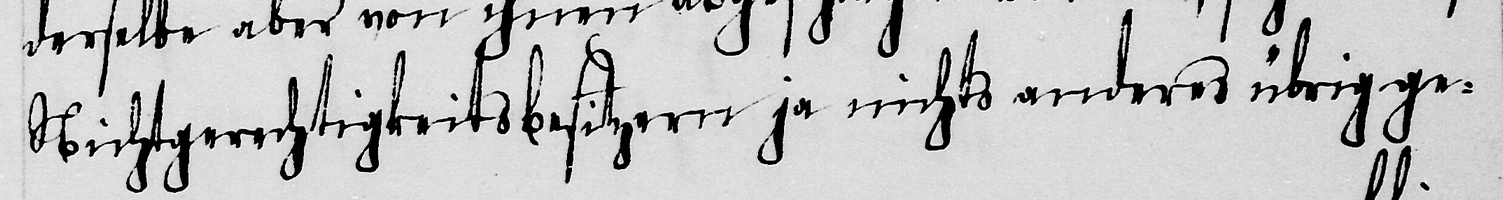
Nichtgerechtigkeitsbesitzern ja nichts anderes übrig ge-
